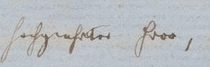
Hochgeehrter Herr,
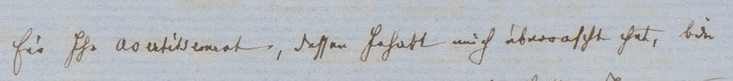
Für Ihr avertissement, dessen Erhalt mich überrascht hat, bin
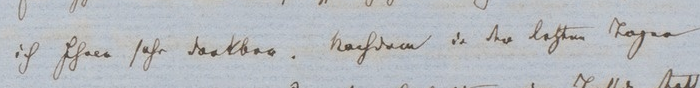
ich Ihnen sehr dankbar. Nachdem in den letzten Tagen
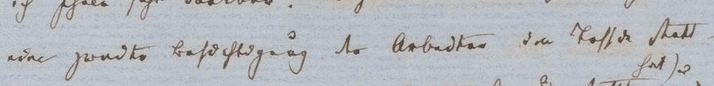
eine zweite Besichtigung der Arbeiten im Tessin statt-
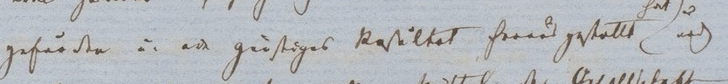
gefunden u. ein günstiges Resultat herausgestellt hat und
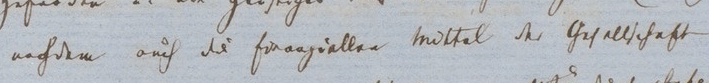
nachdem auch die finanziellen Mittel der Gesellschaft
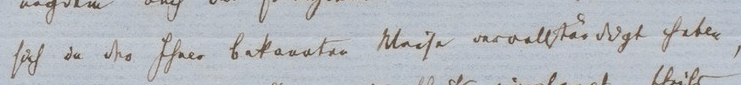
sich in der Ihnen bekannten Weise vervollständigt haben,
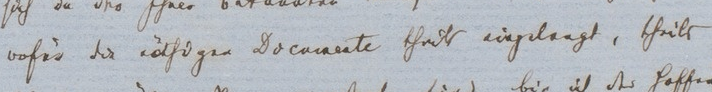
wofür die nöthigen Documente theils eingelangt, theils
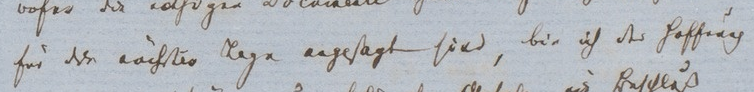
für die nächsten Tage angesagt sind, bin ich der Hoffnung
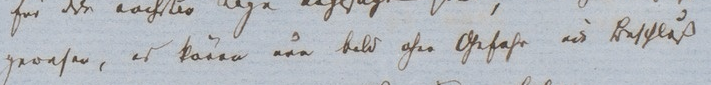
gewesen, es könne nun bald ohne Gefahr ein Beschluß
